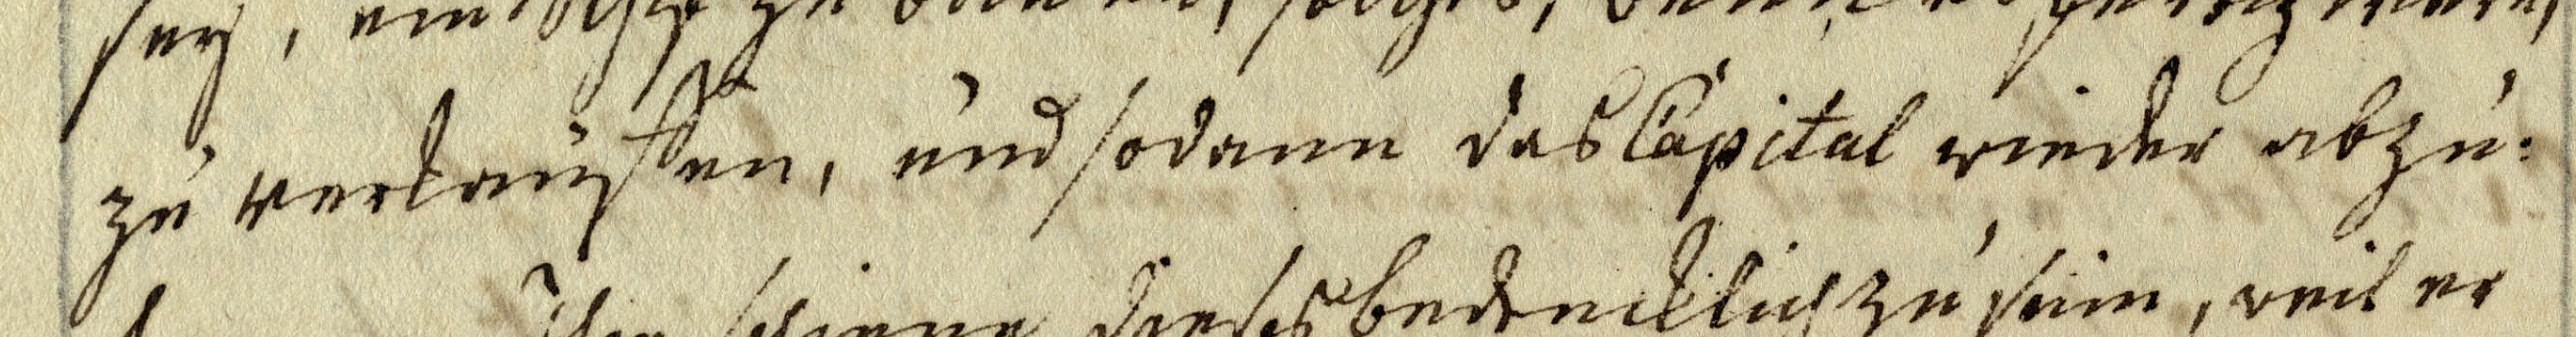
zu verkaufen, und sodann das Capital wieder abzu¬
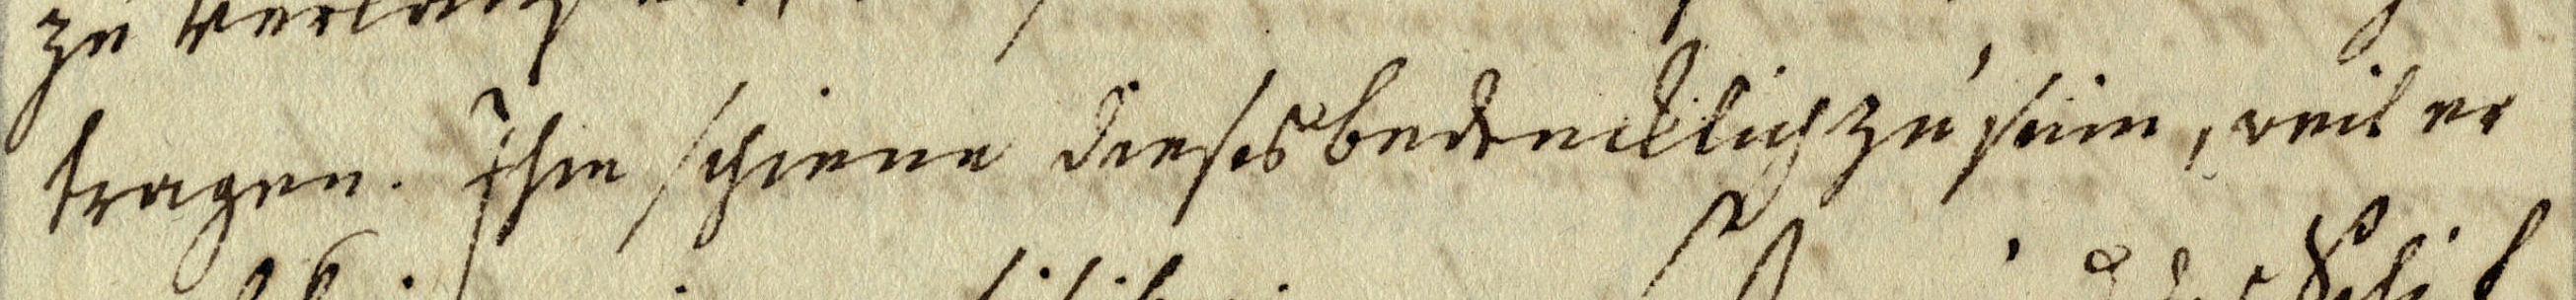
tragen. Ihm schiene dieses bedencklich zu sein, weil er
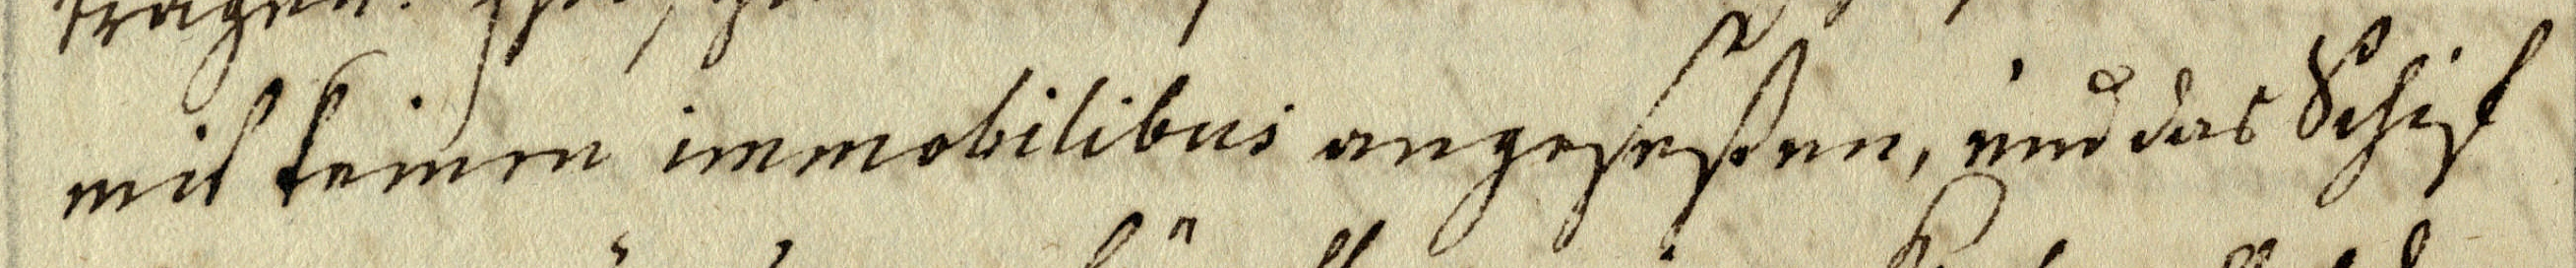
mit keinem immobilibus angeseßen, und das Schif
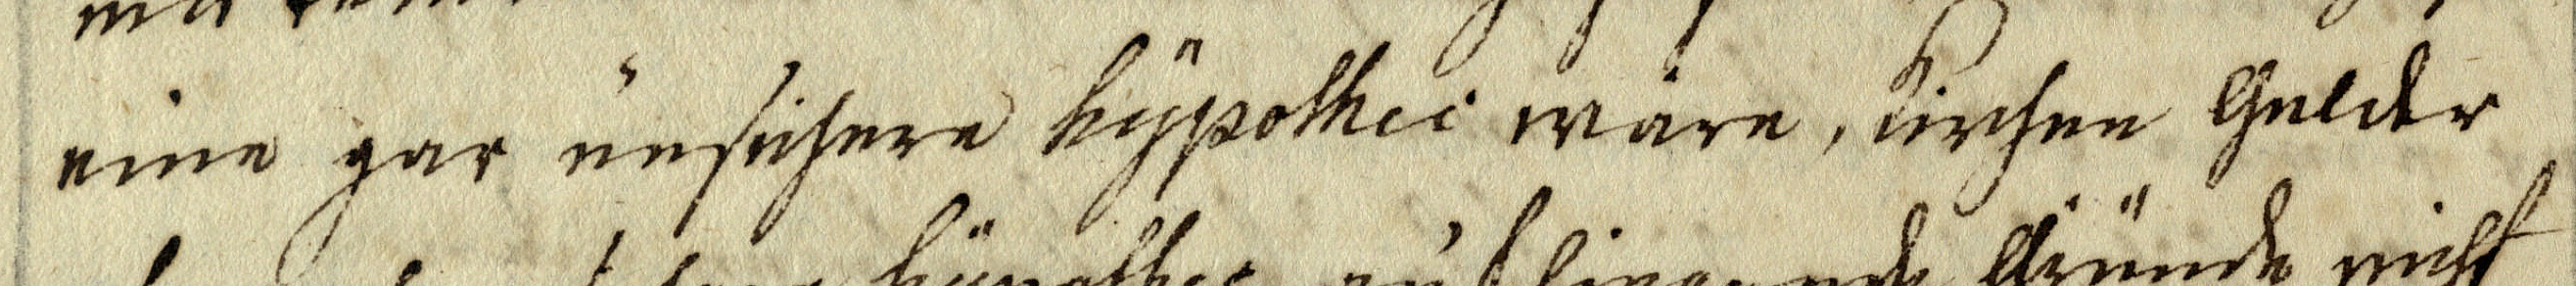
eine gar unsichere hÿpothec wäre, Kirchen Gelder
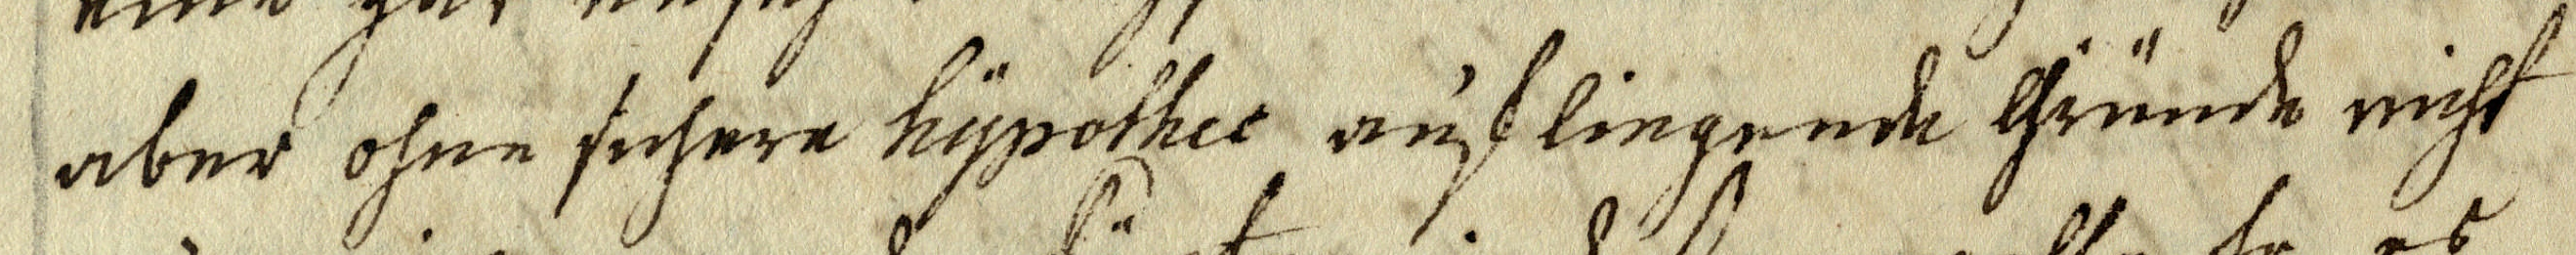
aber ohne sichere hÿpothec auf liegende Gründe nicht
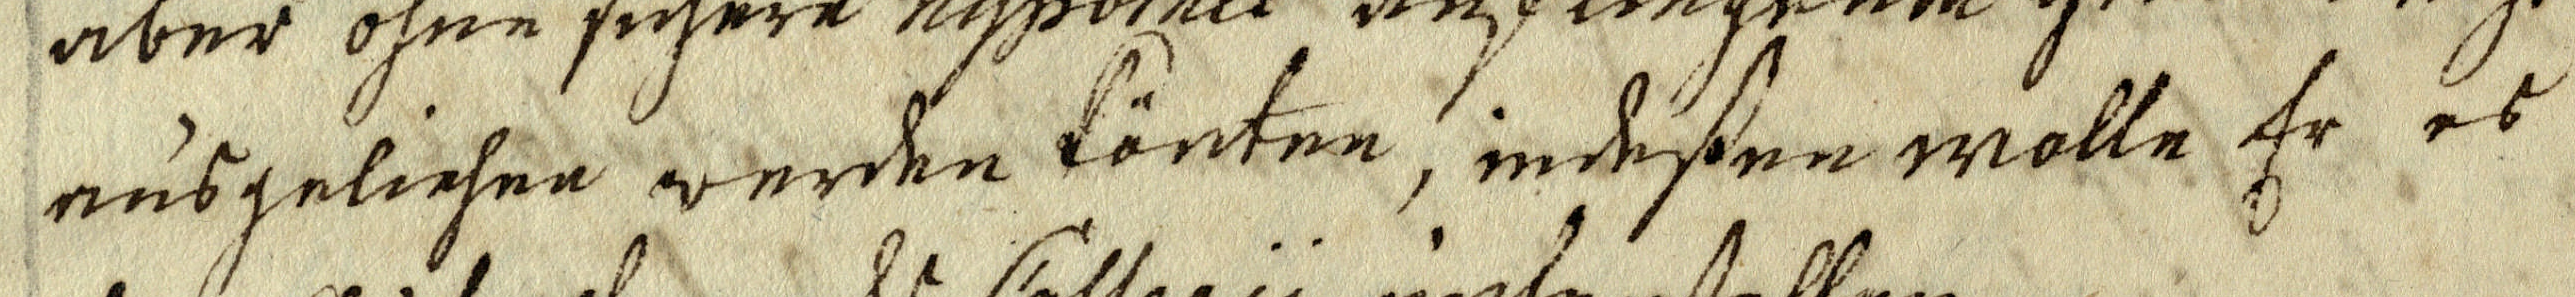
ausgeliehen werden könten, indeßen wolle Er es
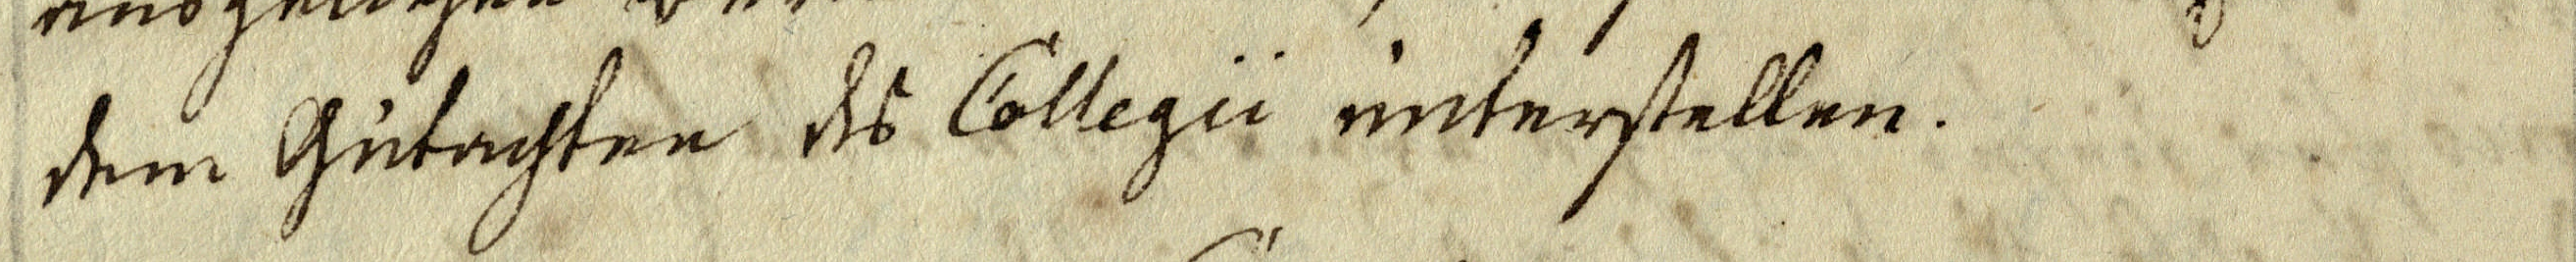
dem Gutachten des Collegii unterstellen.
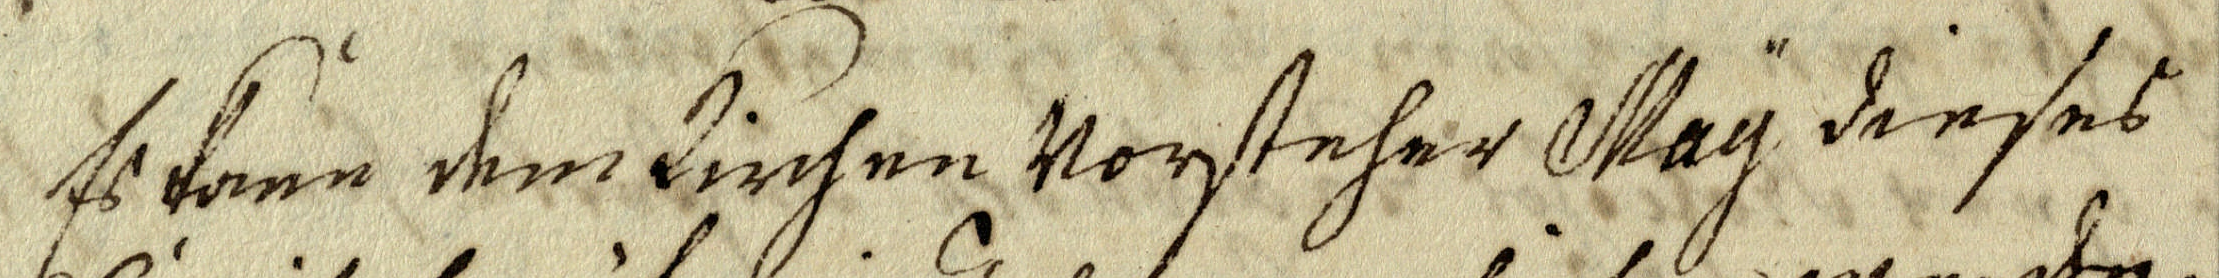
Es kann dem Kirchen Vorsteher Maÿ dieses
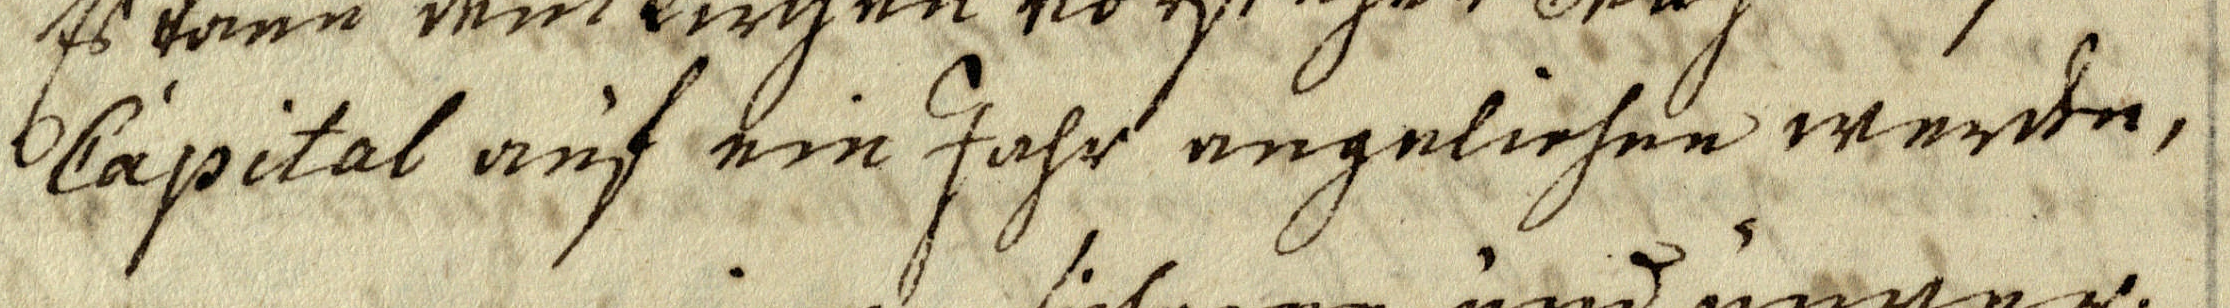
Capital auf ein Jahr angeliehen werden,
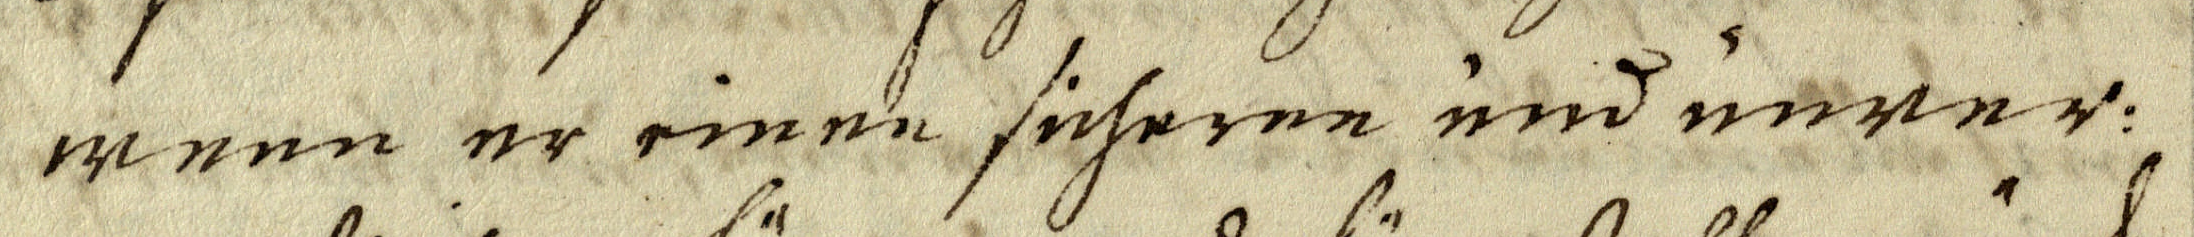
wenn er einen sicheren und unver¬
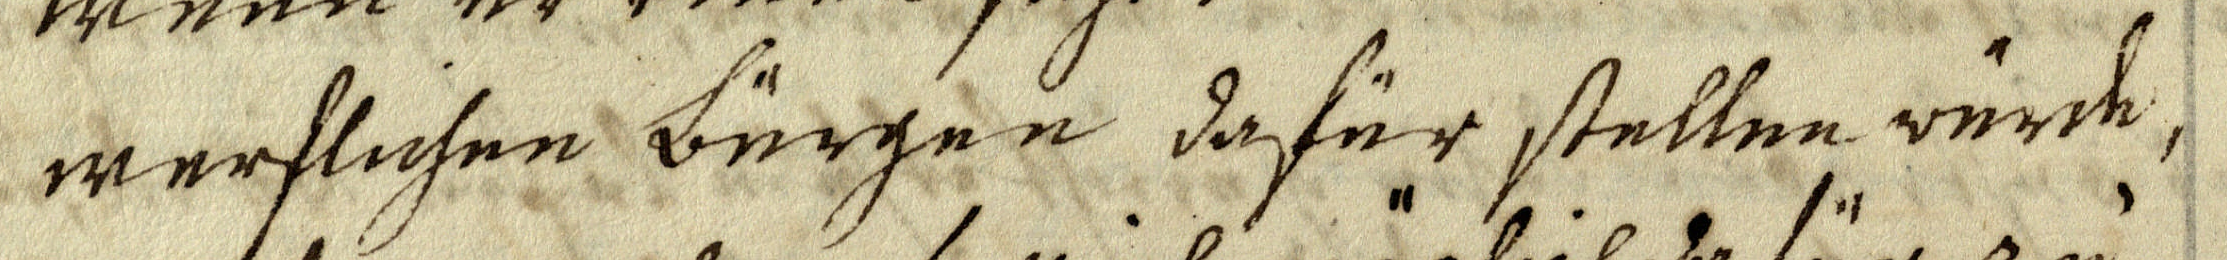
werflichen Bürgen dafür stellen würde,
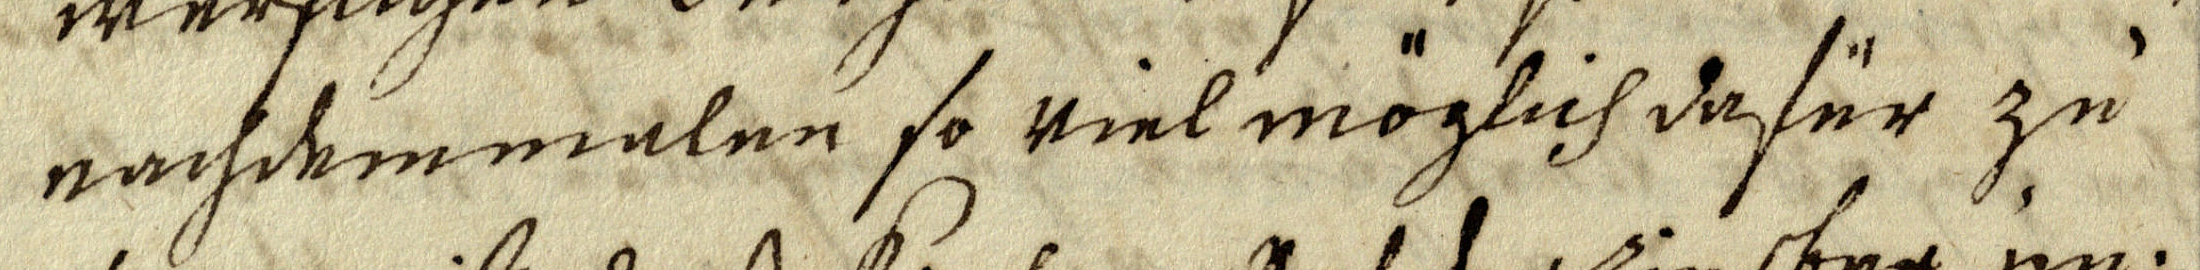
nachdemmalen so viel möglich dafür zu
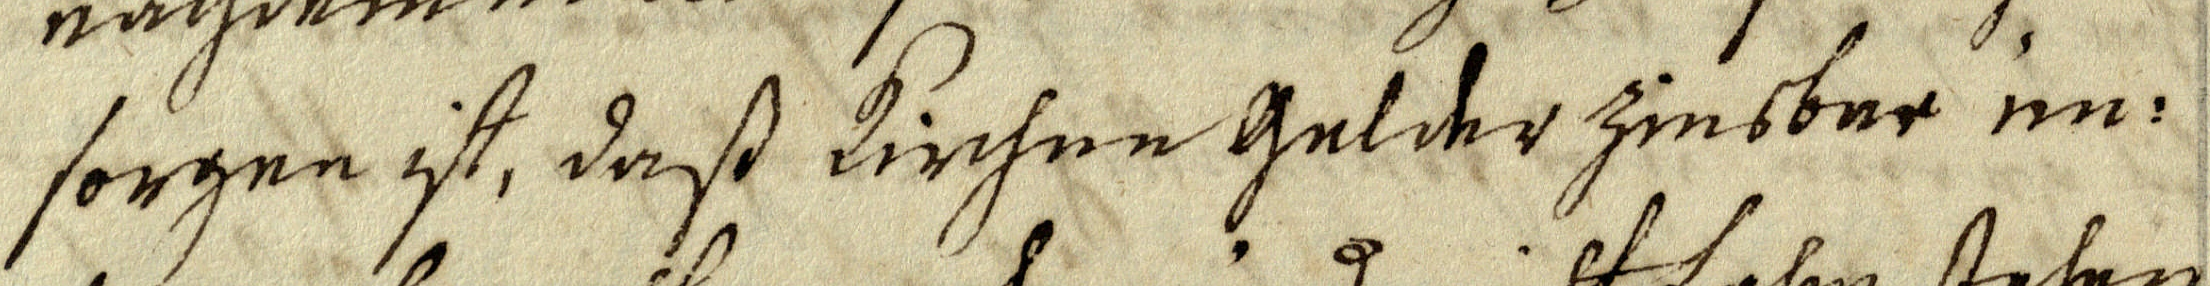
sorgen ist, daß Kirchen Gelder zinsbar un¬
